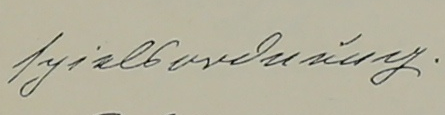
spielsordnung.
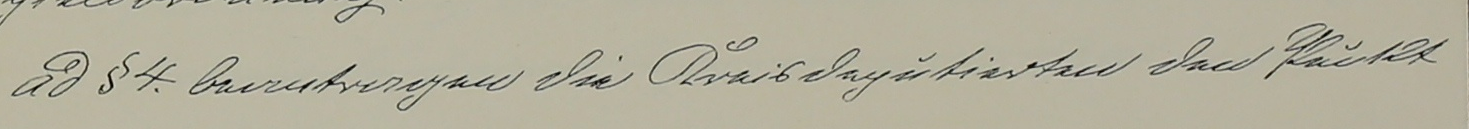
ad § 4. beantragen die Kreisdeputierten den Punkt
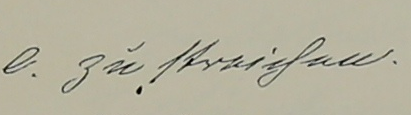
e. zu streichen.
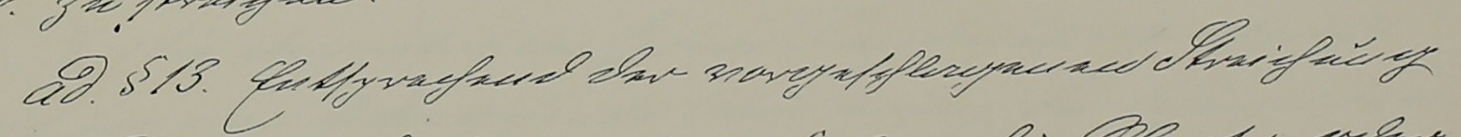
ad § 13. Entsprechend der vorgeschlagenen Streichung
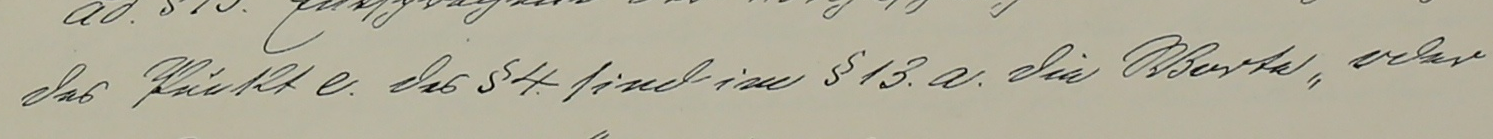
des Punkt e. des § 4. sind im § 13.a. die Worte „oder
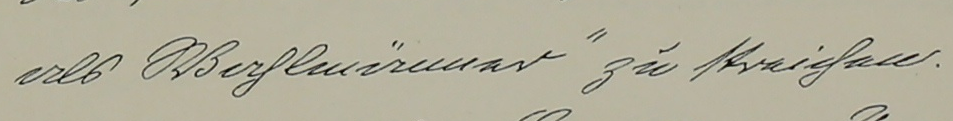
als Wahlmänner“ zu streichen.
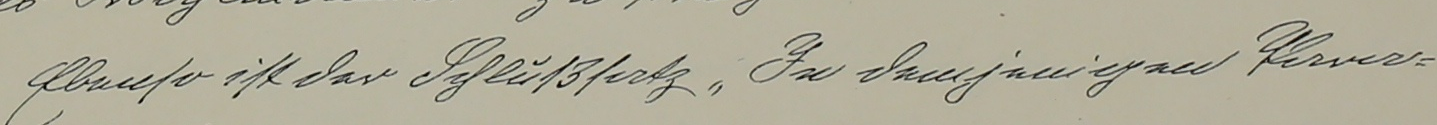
Ebenso ist der Schlußsatz „In demjenigen Para-
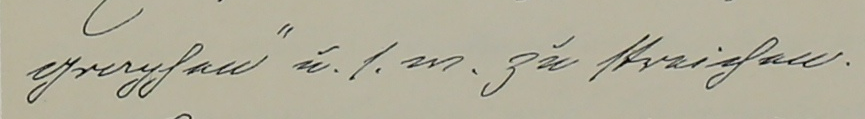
graphen“ u.s.w. zu streichen.
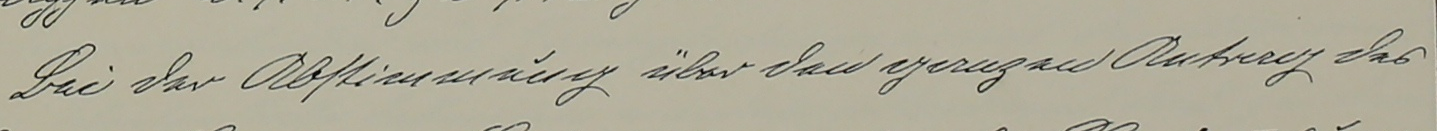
Bei der Abstimmung über den ganzen Antrag des
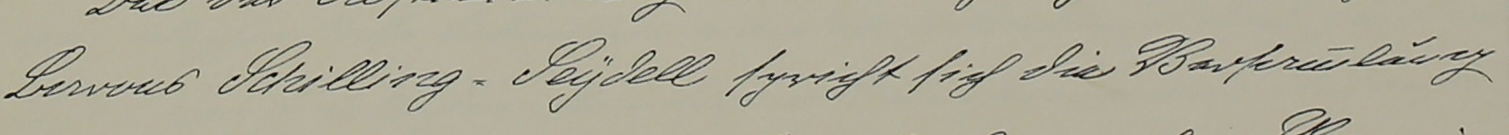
Barons Schilling-Seydell spricht sich die Versammlung
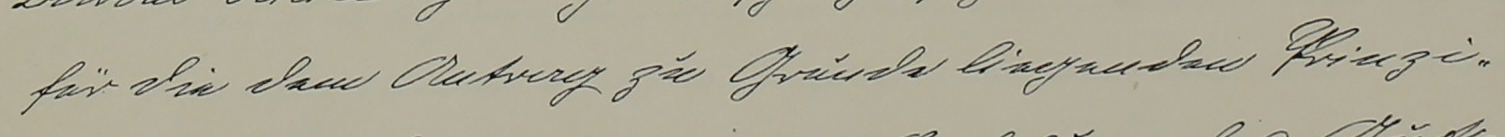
für die dem Antrag zu Grunde liegenden Prinzi-
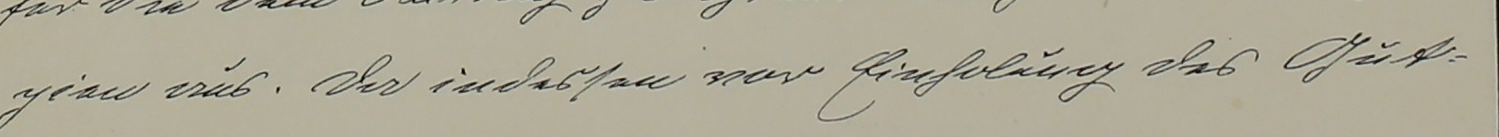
pien aus. Da indessen vor Einholung des Gut-
